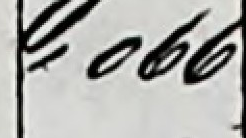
0,066
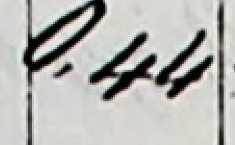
0,44
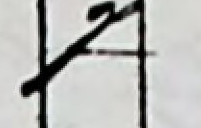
7
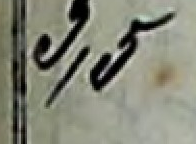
3,5
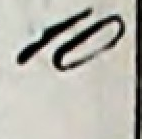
10
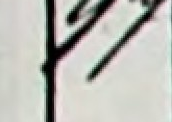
97
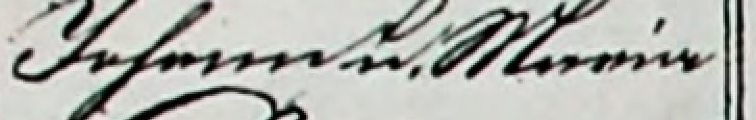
Johann u. Maria
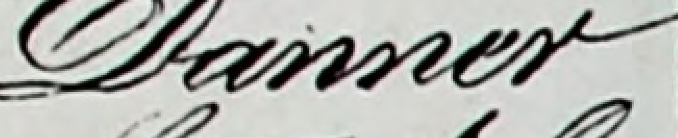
Danner
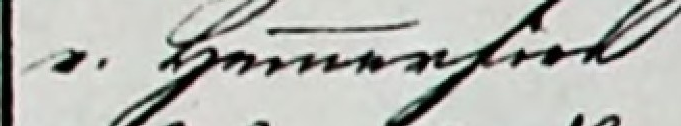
v. Hammerhirs
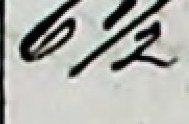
6 ½
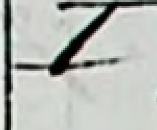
I
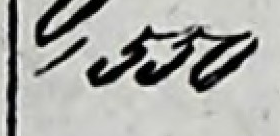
0,550
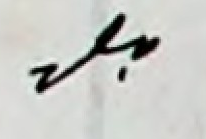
do
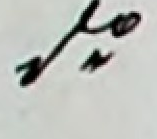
do
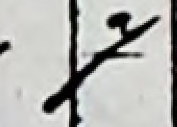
7
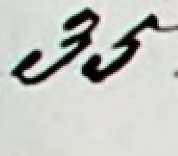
35
